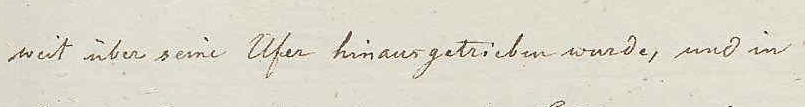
weit über seine Ufer hinausgetrieben wurde, und in
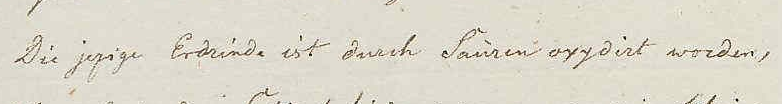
Die jezige Erdrinde ist durch Säuren oxydirt worden,
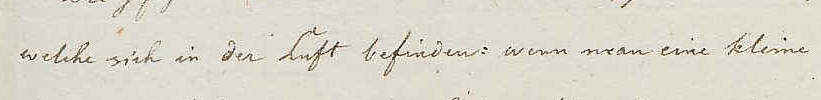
welche sich in der Luft befinden: wenn man eine kleine
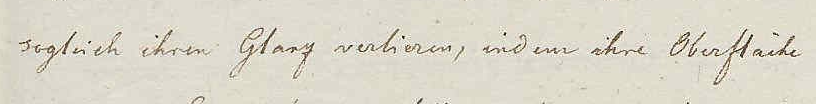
sogleich ihren Glanz verlieren, indem ihre Oberfläche
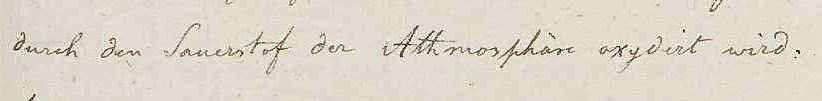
durch den Sauerstof der Athmosphäre oxydirt wird.
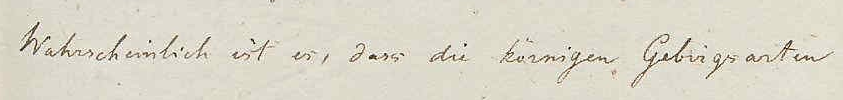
Wahrscheinlich ist es, dass die körnigen Gebirgsarten
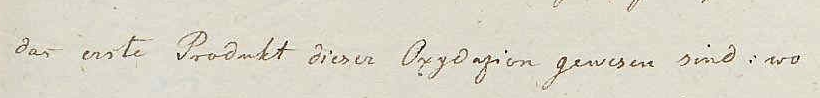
das erste Produkt dieser Oxydazion gewesen sind: wo
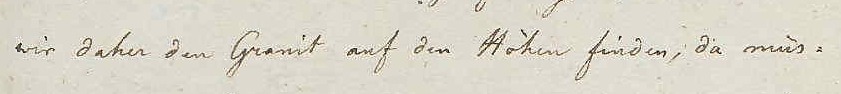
wir daher den Granit auf den Höhen finden, da müs-
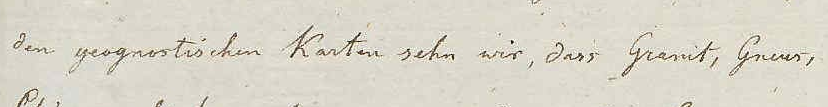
den geognostischen Karten sehn wir, dass Granit, Gneus,
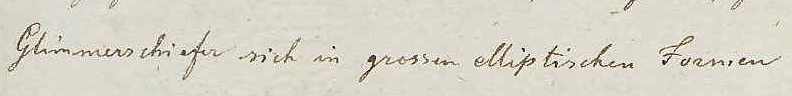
Glimmerschiefer sich in grossen elliptischen Formen
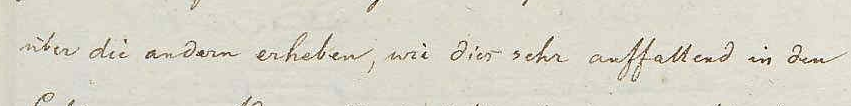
über die andern erheben, wie dies sehr auffallend in den
